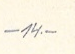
-14.-
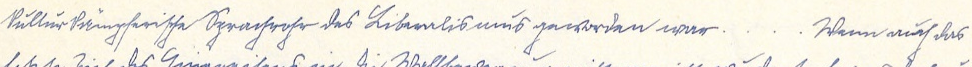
kulturkämpferische Sprachrohr des Liberalismus geworden war . . . . Wann auch das
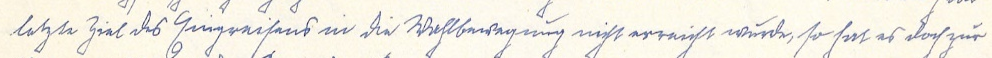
letzte Ziel des Eingreifens in die Wahlbewegung nicht erreicht wurde, so hat es doch zur
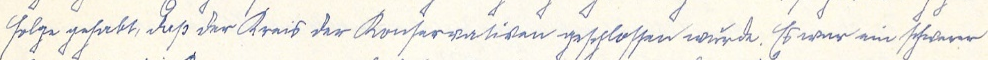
Folge gehabt, daß der Kreis der Konservativen geschlossen wurde. Es war ein schwerer
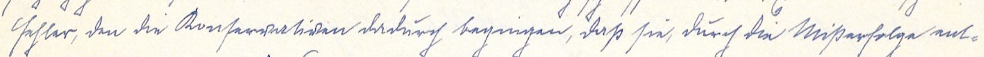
Fehler, den die Konservativen dadurch begingen, daß sie, durch die Mißerfolge ent-
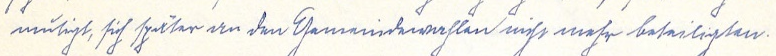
mutigt, sich später an den Gemeindewahlen nicht mehr beteiligten.
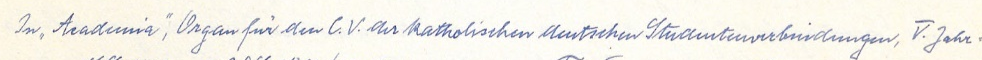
In "Academia", Organ für den C. V. der katholischen deutschen Studentenverbindungen, V. Jahr-
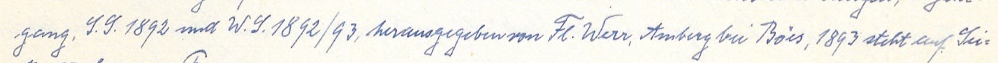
gang, S. S. 1892 und W. S. 1892/93, herausgegeben von Fl. Werr, Amberg bei Boes, 1893 steht auf Sei-
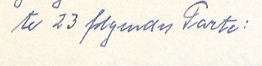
te 23 folgende Parte:
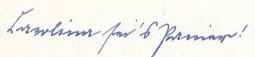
Carolina sec's Premier!
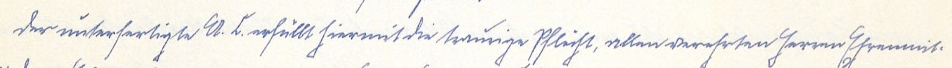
Der unterfertigte A. C. erfüllt hiermit die traurige Pflicht, allen verehrten Herren Ehrenmit-
